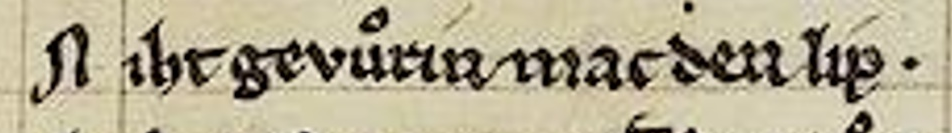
Niht gevu°orin mac den lip.
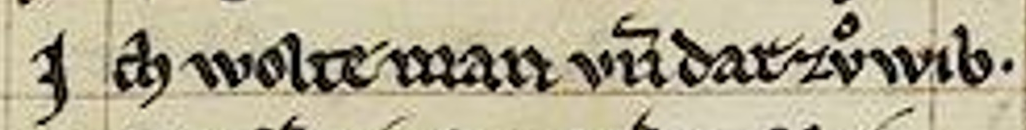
Ich wolte man vn(d) dar zv°o wib.
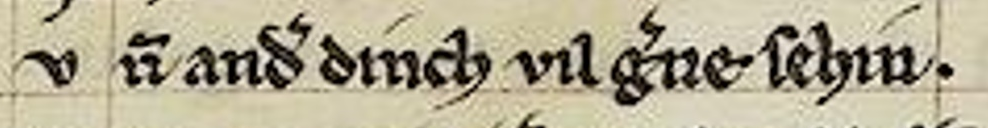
Vn(d) and(er) dinch vil g(er)ne ſehin.
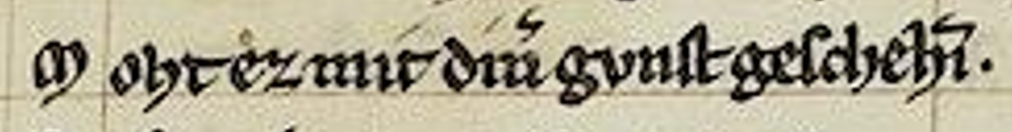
Moht ez mit din(er) gvnſt geſchehi(n).
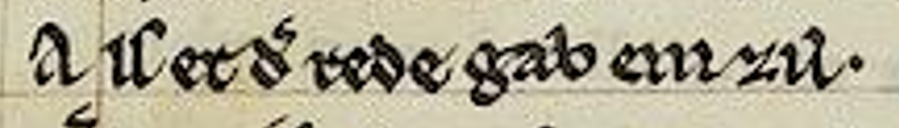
Alſ er d(er) rede gab ein zil.
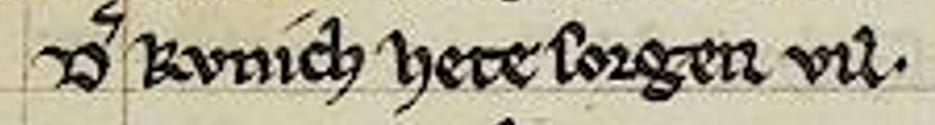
D(er) kvnich hete ſorgen vil.
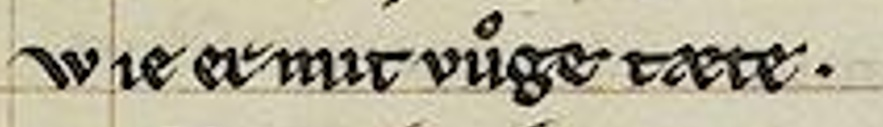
Wie er mit vu°oge t[ae]te.
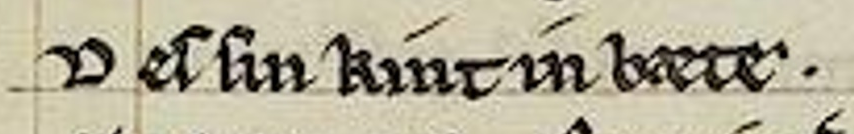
Deſ ſin kint in b[ae]te.
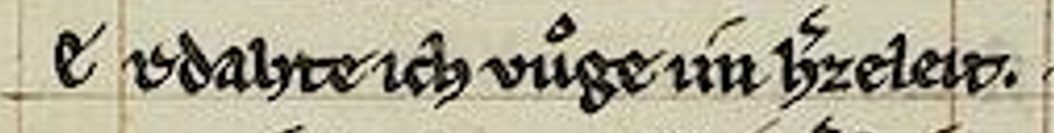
Erdahte ich vu°oge im h(er)zeleit.
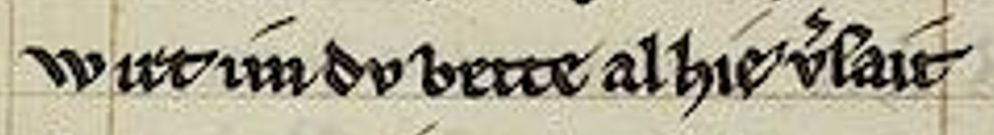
Wirt im dv bette alhie v(er)ſait.
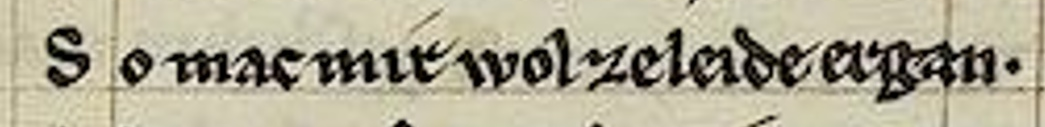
So mac mir wol zeleide ergan.
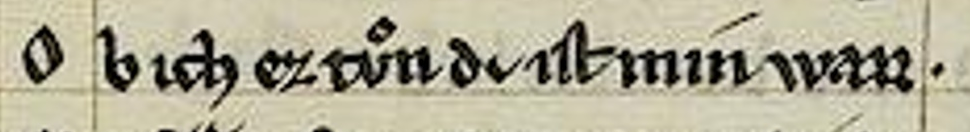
Ob ic ez tv°on d(az) iſt min wan.
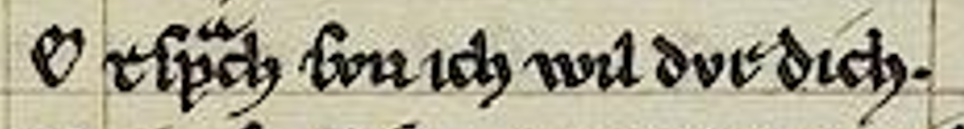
Erſp(ra)ch ſvn ich wil dvr dich.
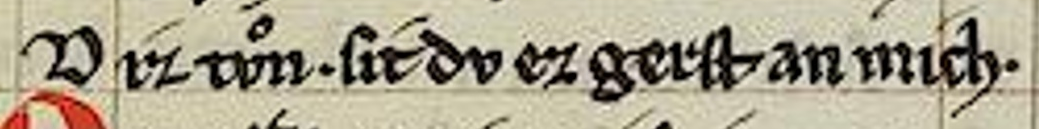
Diz tv°on. ſit dv ez gerſt an mich.
